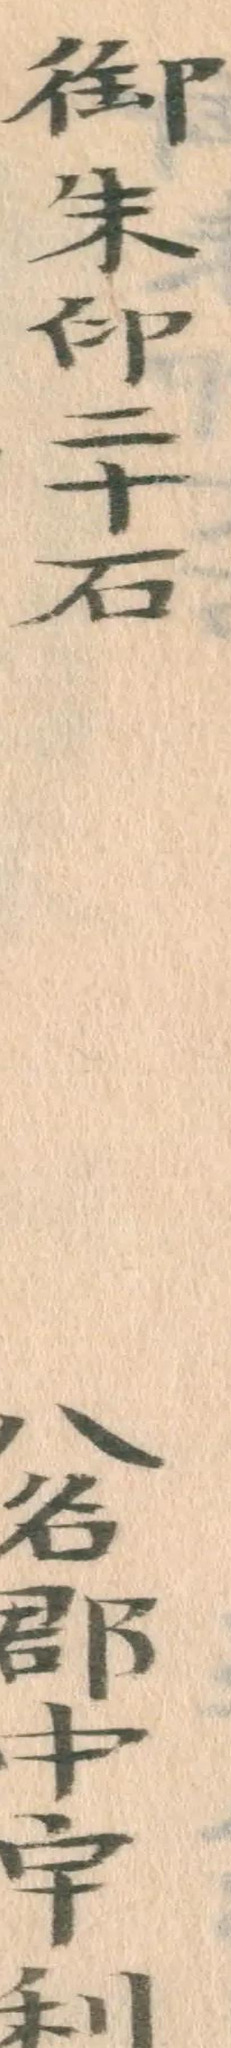御朱印二十石八名郡中宇利村

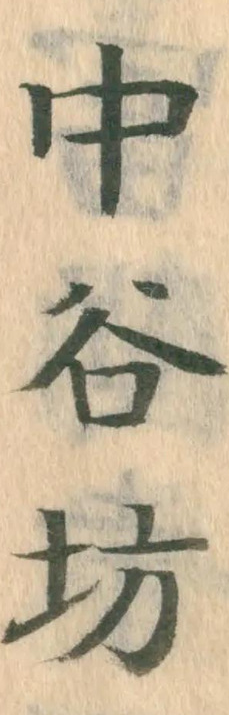中谷坊
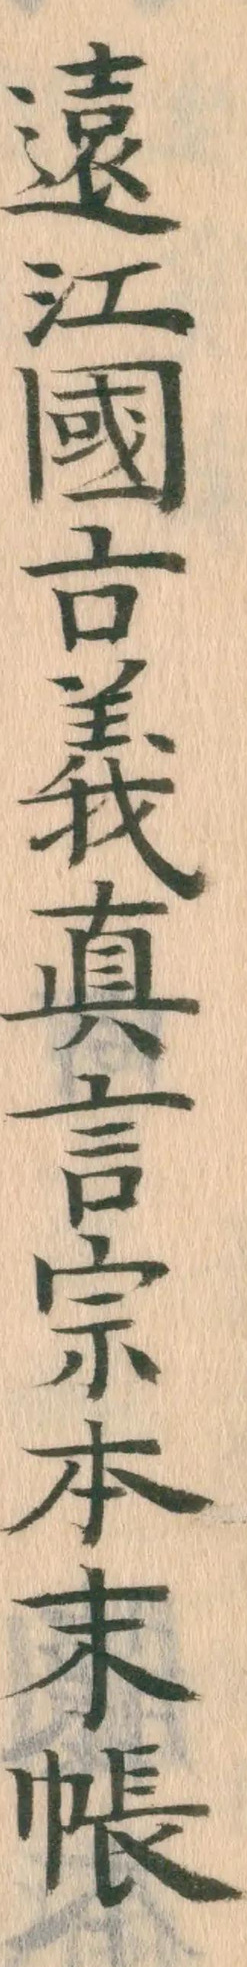遠江国古義真言宗本未帳
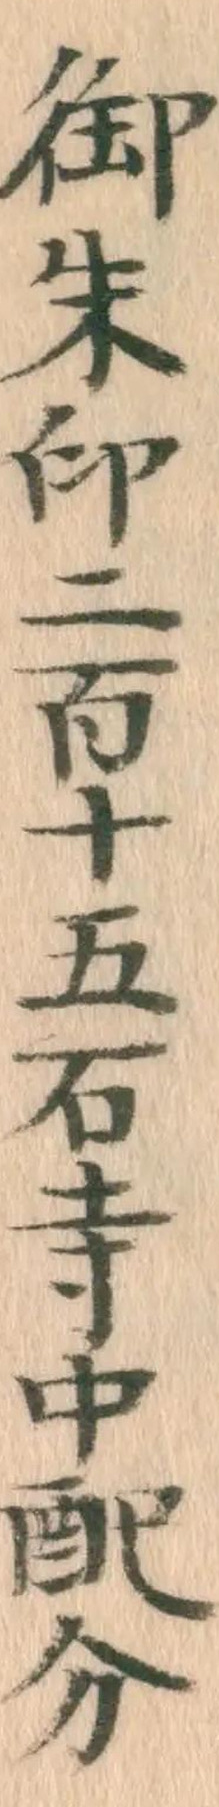御朱印二百十五石寺中配分
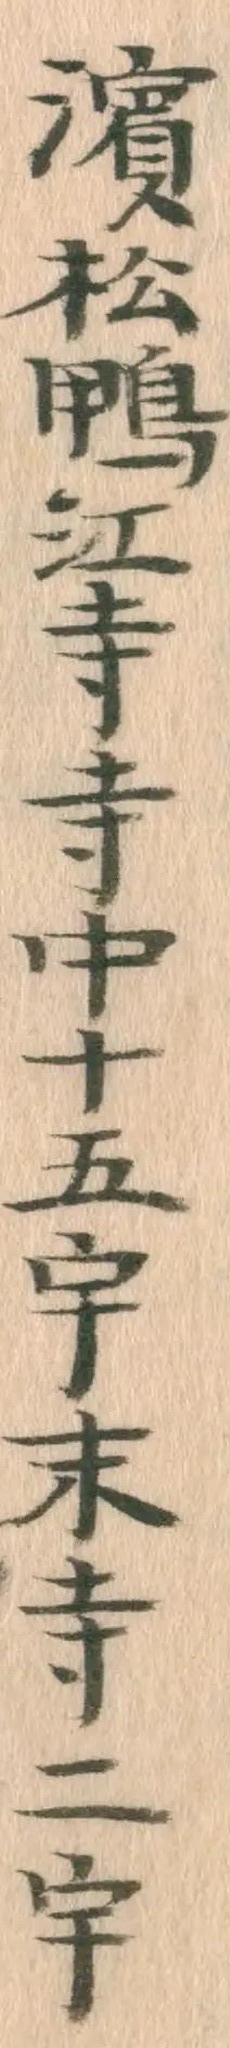浜松鴨江寺寺中十五宇未寺二宇
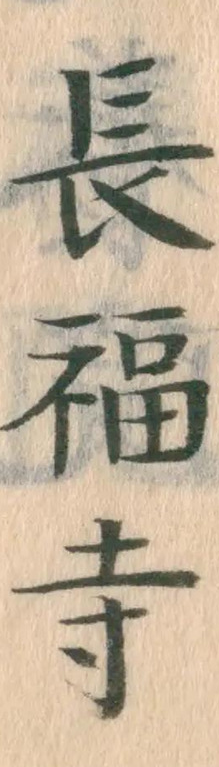長福寺

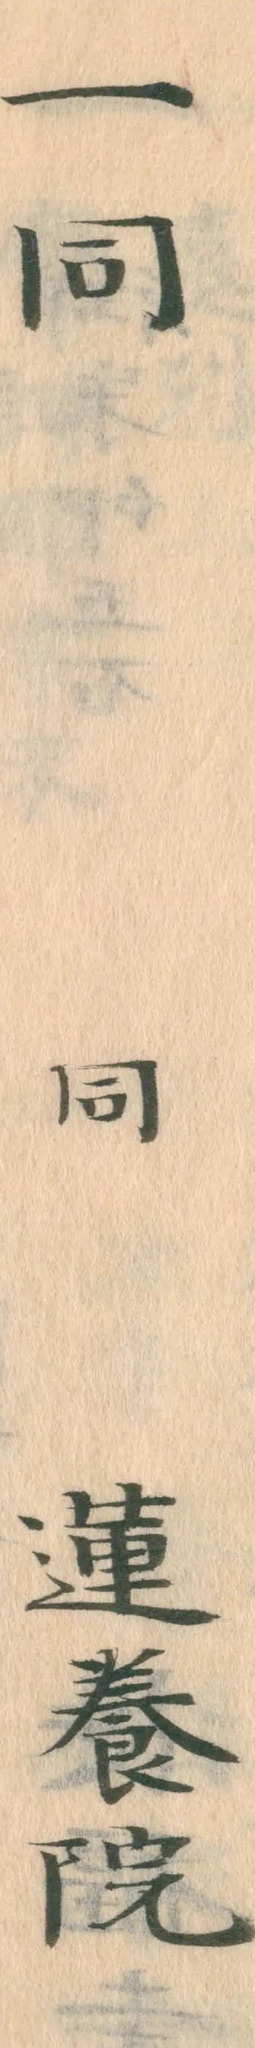一同同蓮養院
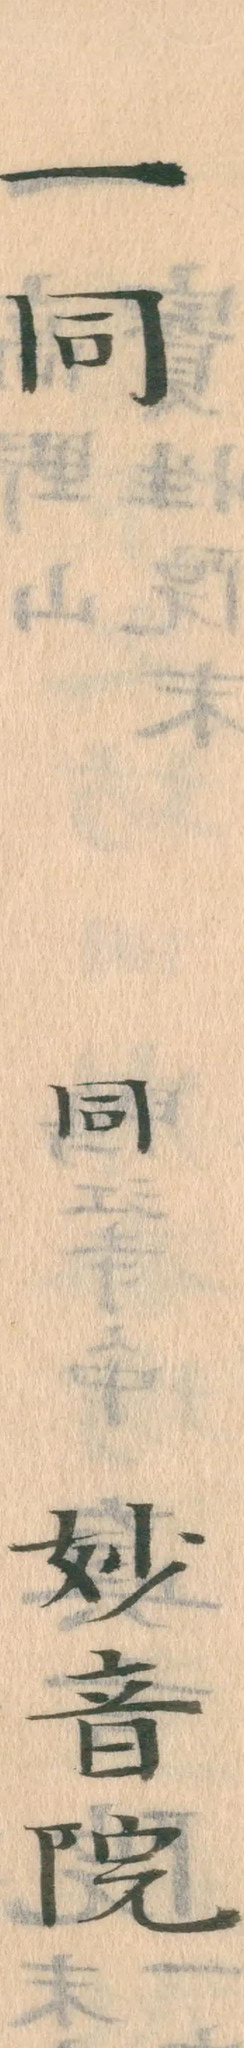一同同妙音院
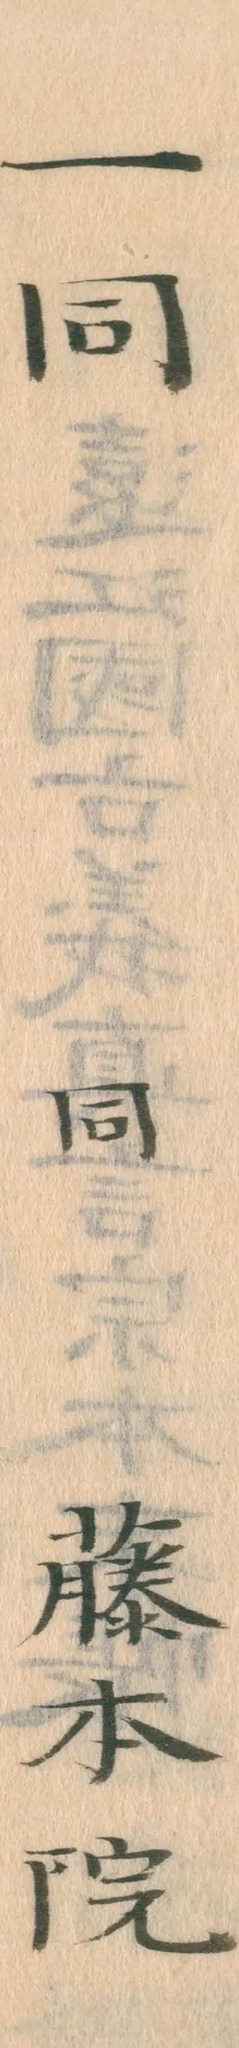一同同藤木院
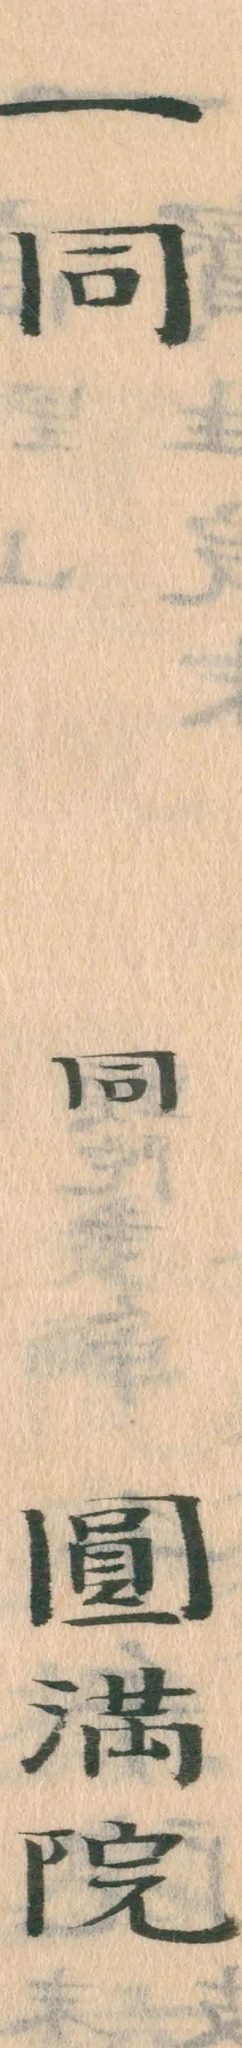一同同円満院
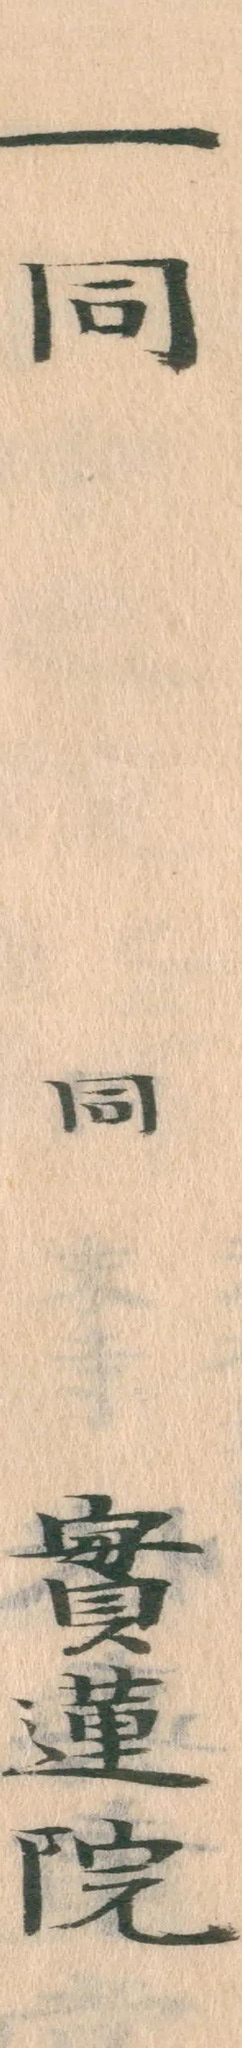一同同實蓮院
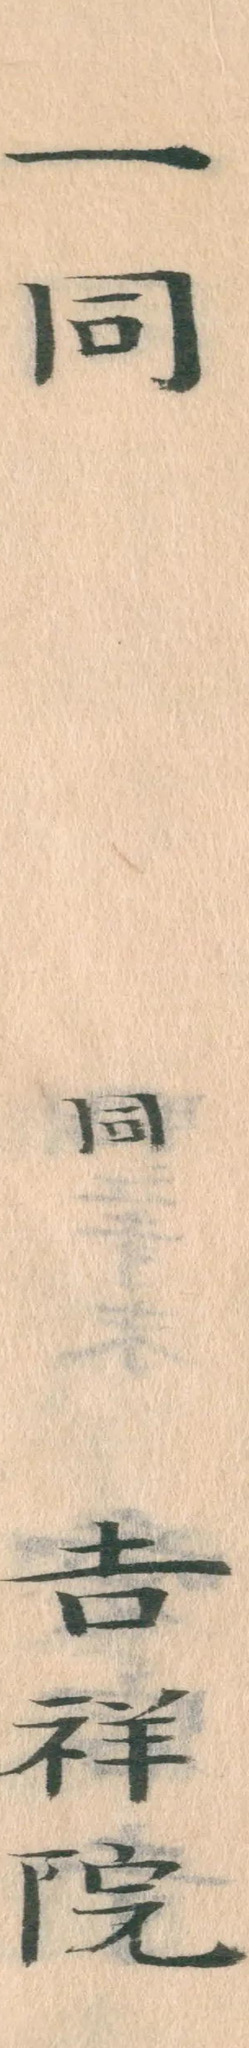一同同吉祥院
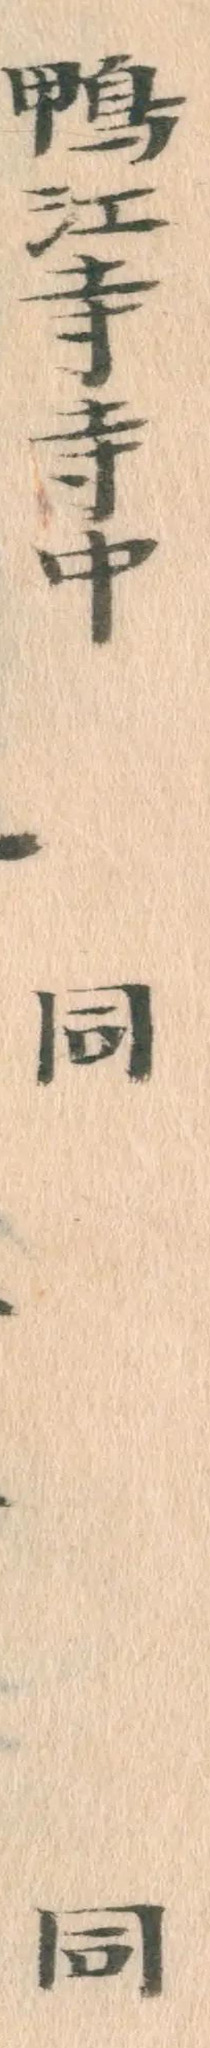鴨江寺寺中同同
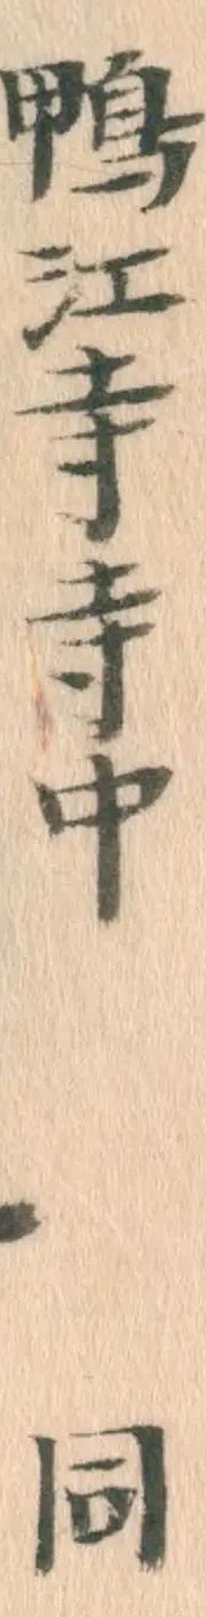鴨江寺寺中同同
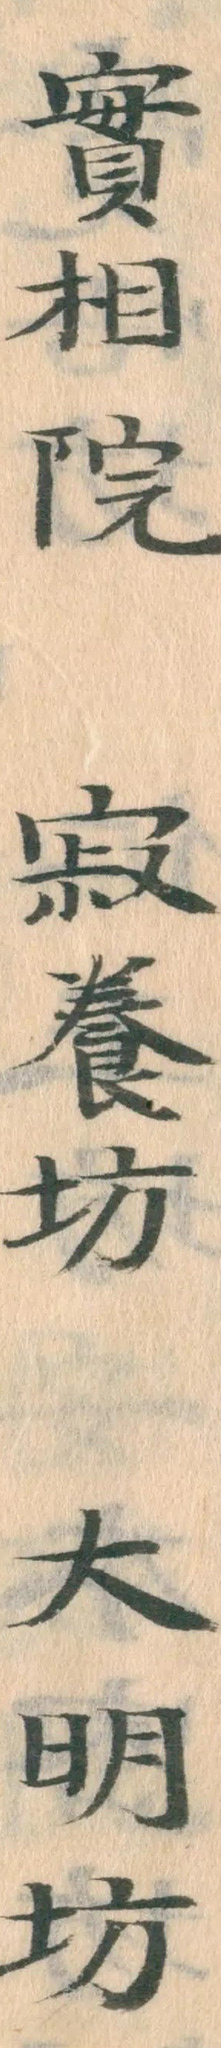實相印寂養坊大明坊

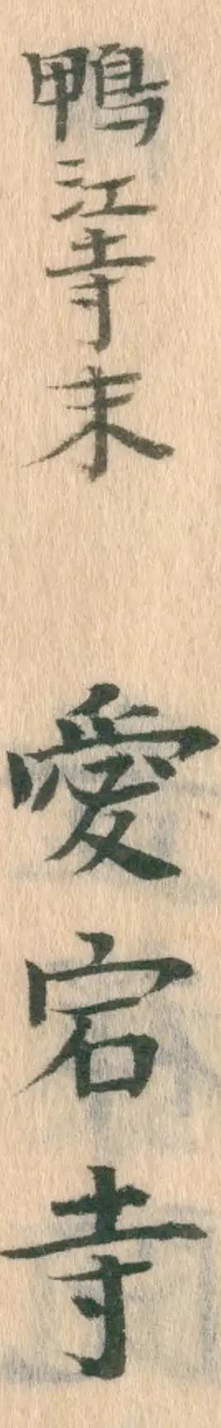鴨江寺未愛宕寺
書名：古義真言宗本末帳 21巻. [4] 第三 伊賀国、伊勢国、志摩国、尾張国、三河国、遠江国、駿河国、伊豆国、甲斐国
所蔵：国立国会図書館 National Diet Library, JAPAN
